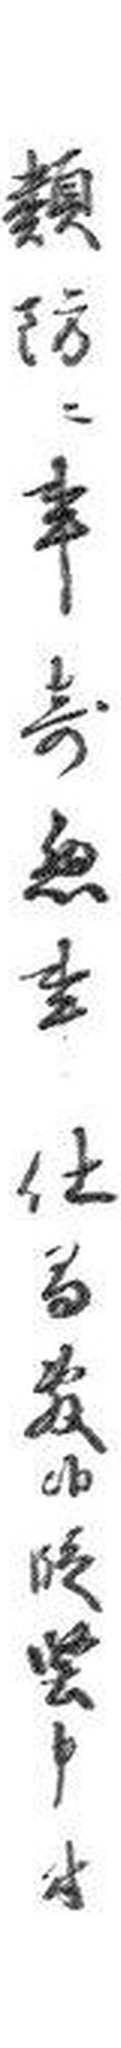類防ニ事寄悪事仕間敷候段堅申付
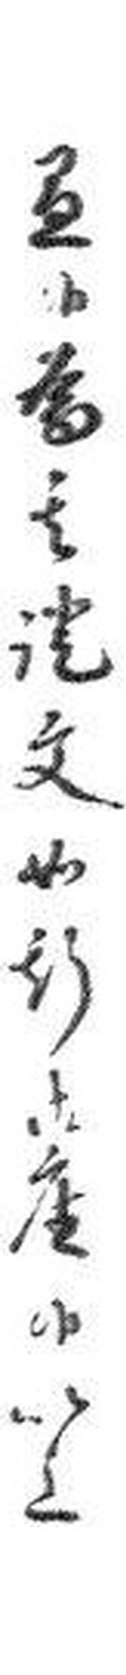置候為其証文如斯御座候以上
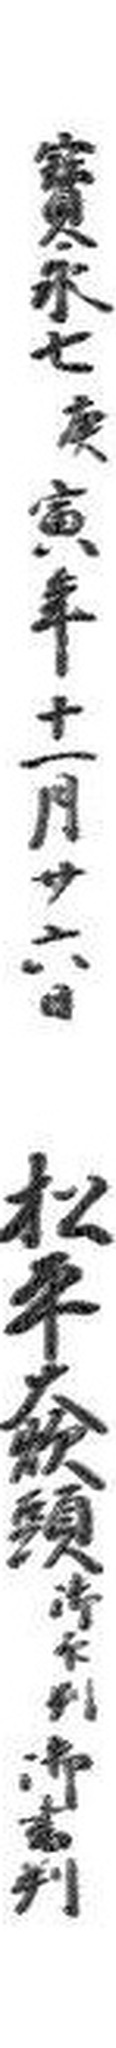宝永七庚寅年十一月廿六日松平大炊頭御印判御書判
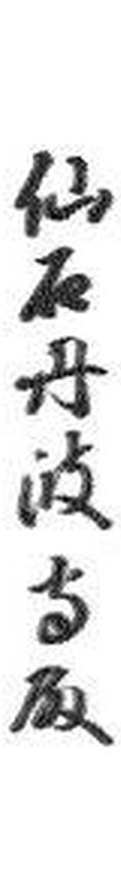仙石丹波守殿
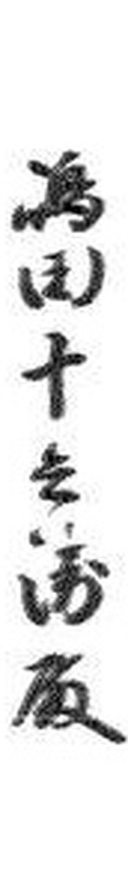嶋田十兵衛殿
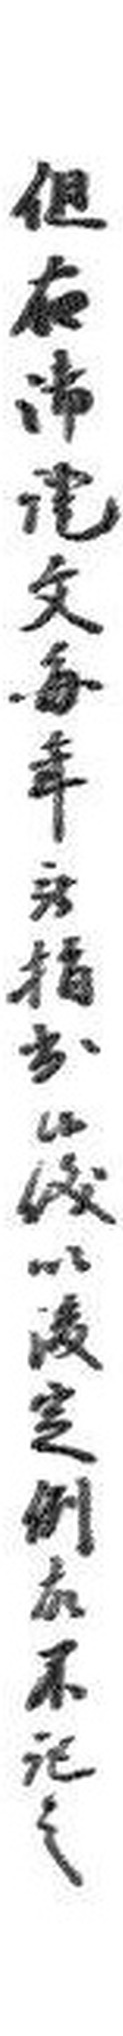但右御証文毎年被指出候儀以後定例故不記之
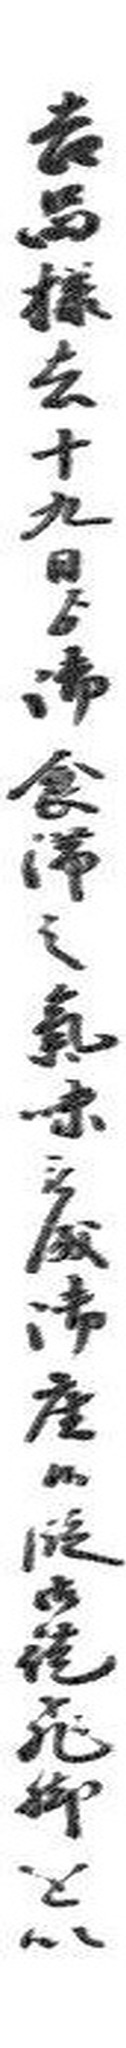吉品様去十九日ゟ御食滞之気味被成御座候段御徒飛脚を以
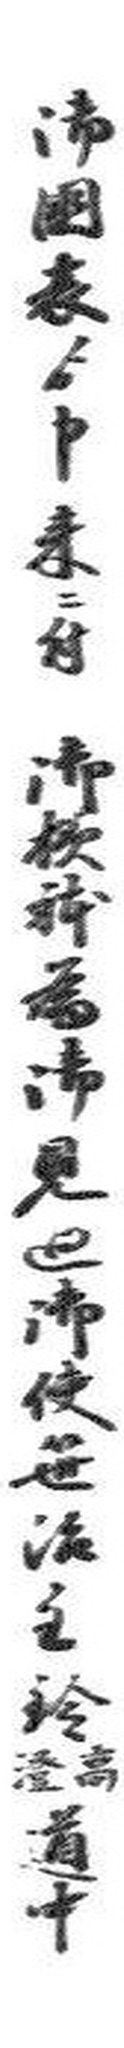御国表ゟ申来ニ付御様体為御見廻御使笹治主鈴高澄道中
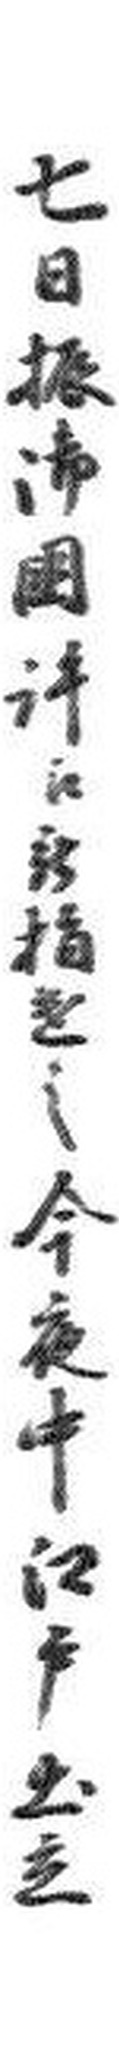七日振御国許江被指遣之今夜中江戸出立

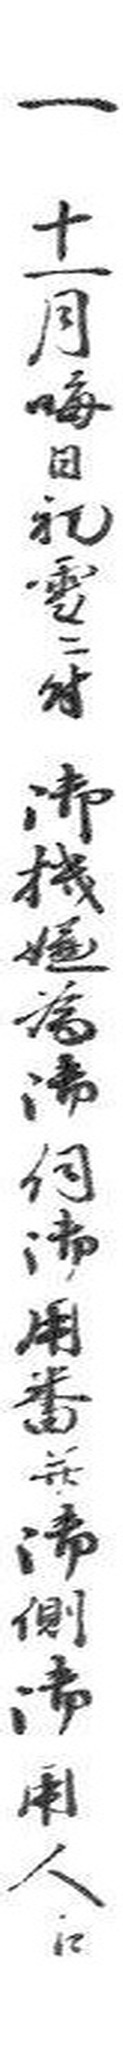一十一月晦日初雪ニ付御機嫌為御伺御用番并御側御用人江
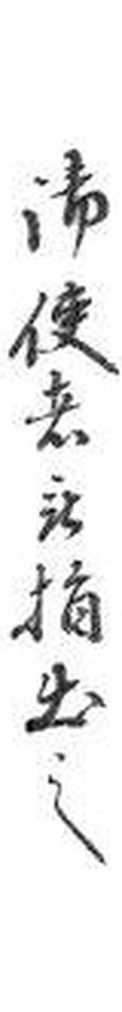御使者被指出之
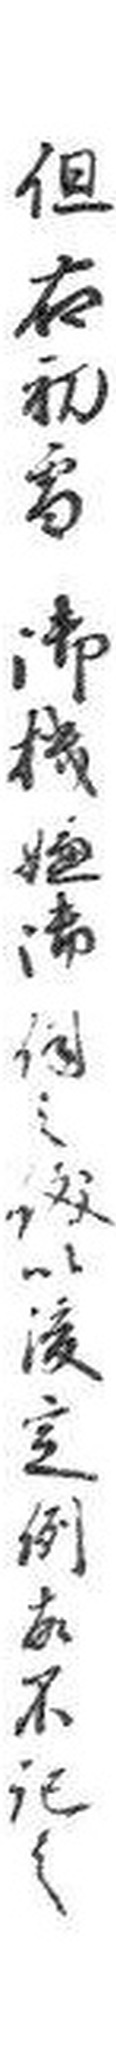但右初雪御機嫌御伺之儀以後定例故不記之
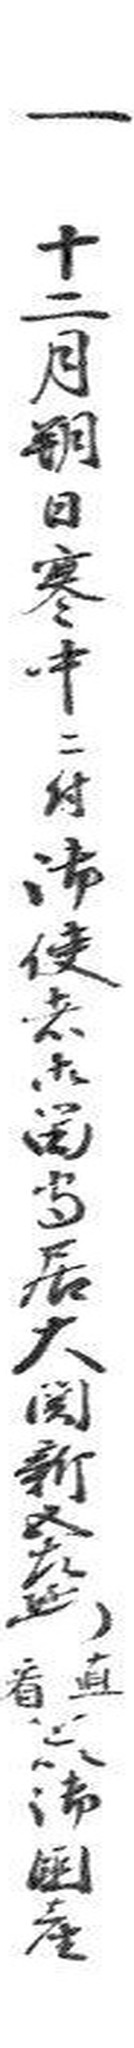一十二月朔日寒中ニ付御使者御留守居大関新五左衛門直看を以御国産
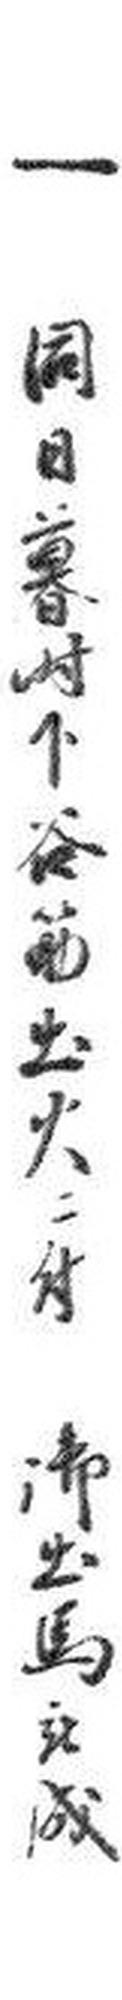一同日暮時下谷筋出火ニ付御出馬被成
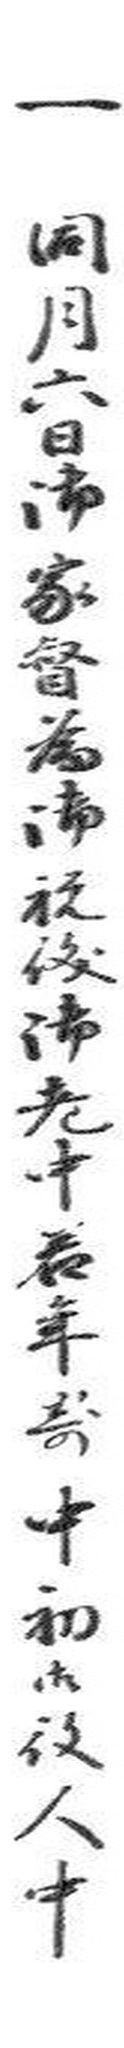一同月六日御家督為御祝儀御老中若年寄中初御役人中
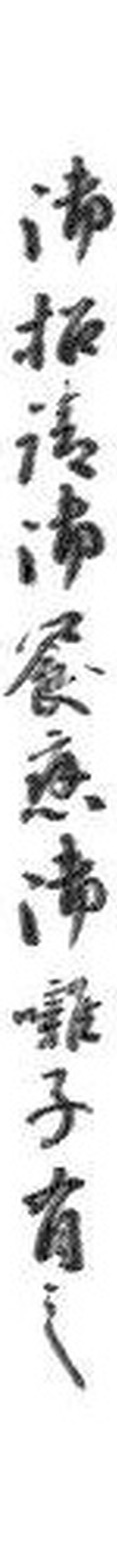御招請御饗応御囃子有之
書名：家譜 二十八 吉邦公 従宝永七年七月五日到正徳元年十二月
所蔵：福井県文書館 Fukui Prefectural Archives
